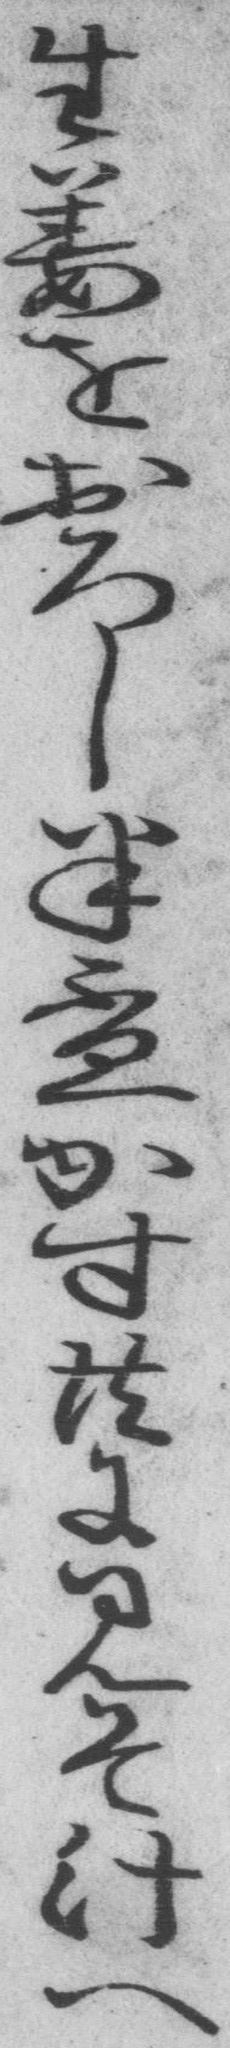生姜をおろし半盃かす共にみそ汁へ
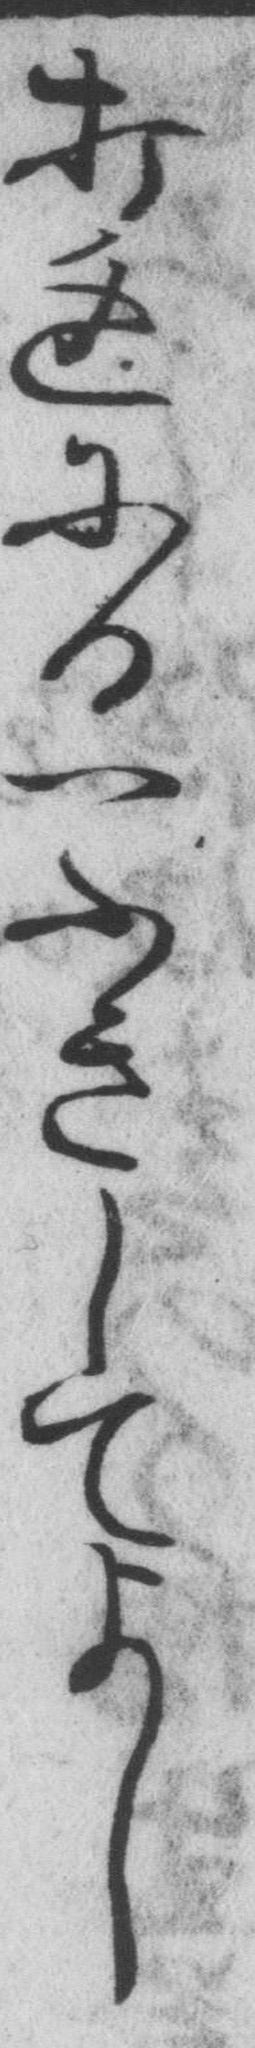打込にる一ふきしてよし
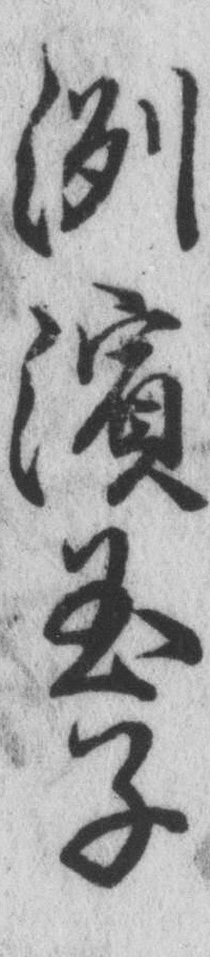洲浜玉子
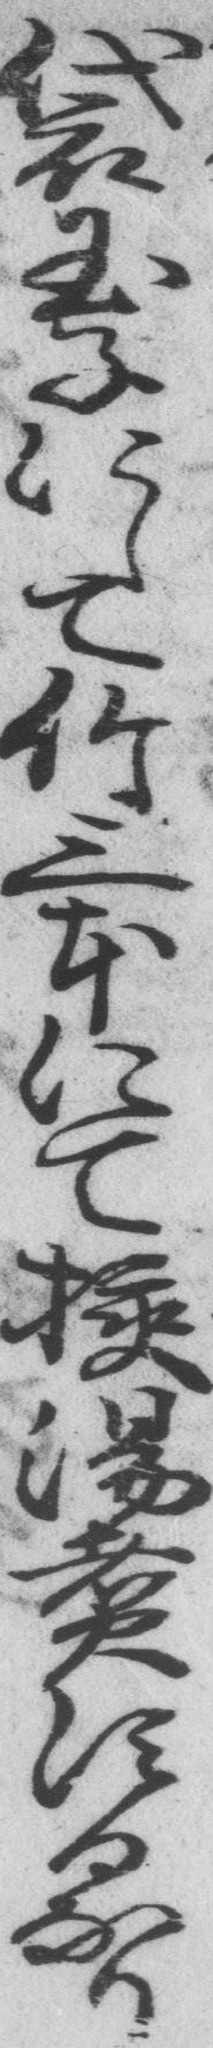袋玉子にして竹三本にて挟湯煮するなり
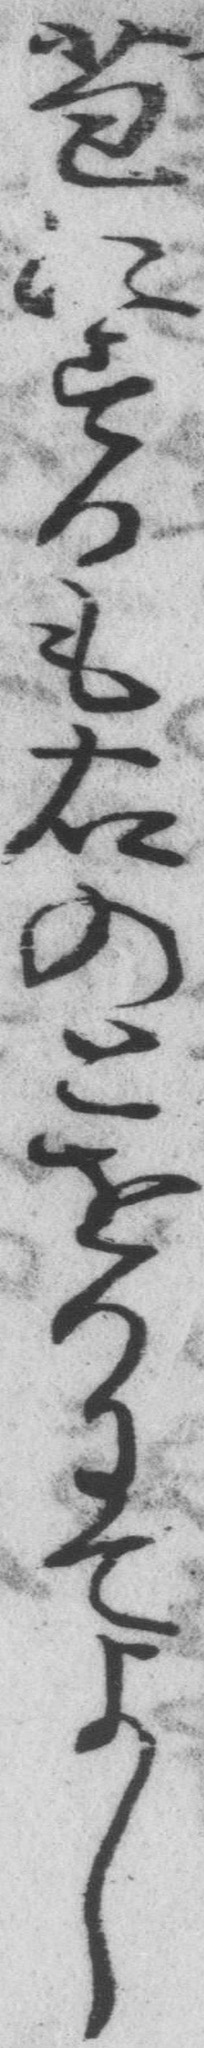苞にするも右のとをりにてよし
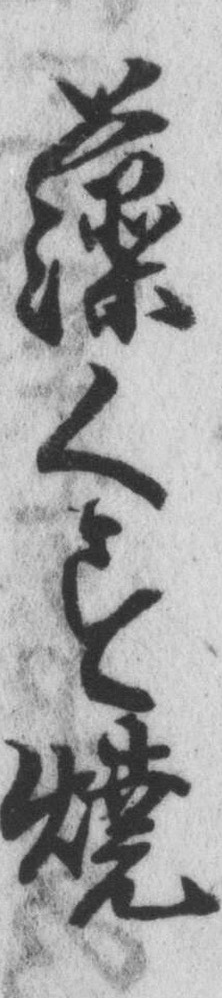藻くす焼
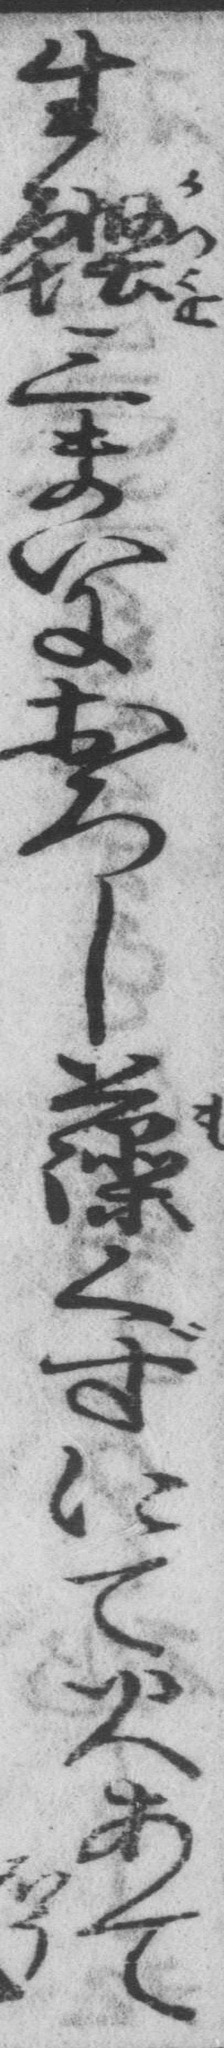生鰹三まいにおろし藻くずにて火あて
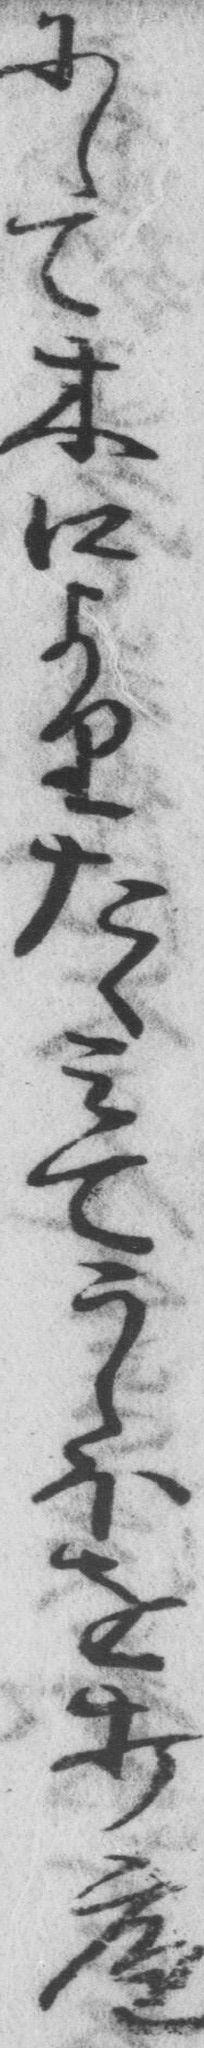にして木口よりたゝみてうしほを打庖
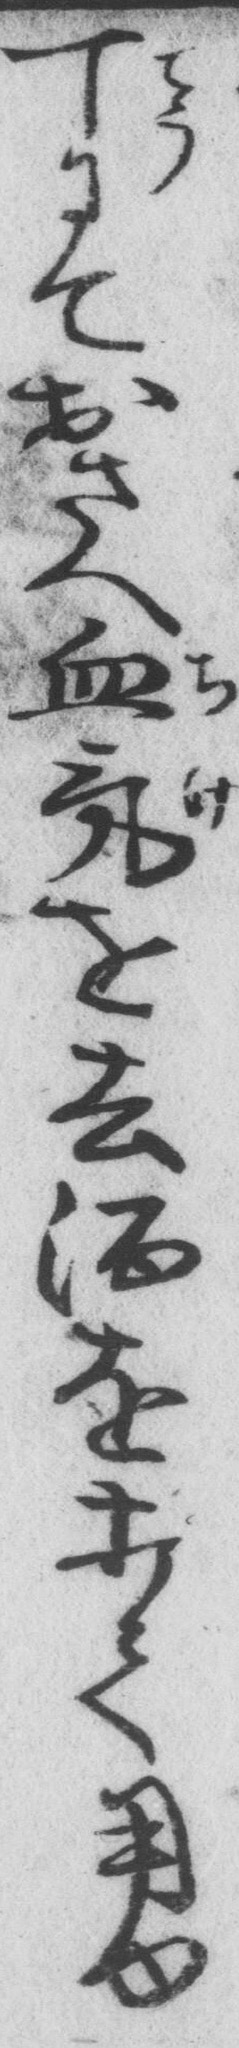丁にておさへ血気を去酒を打て用ゆ
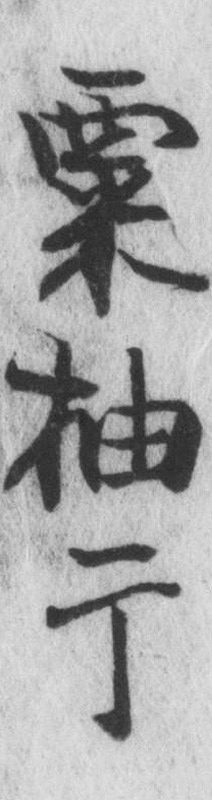粟柚干
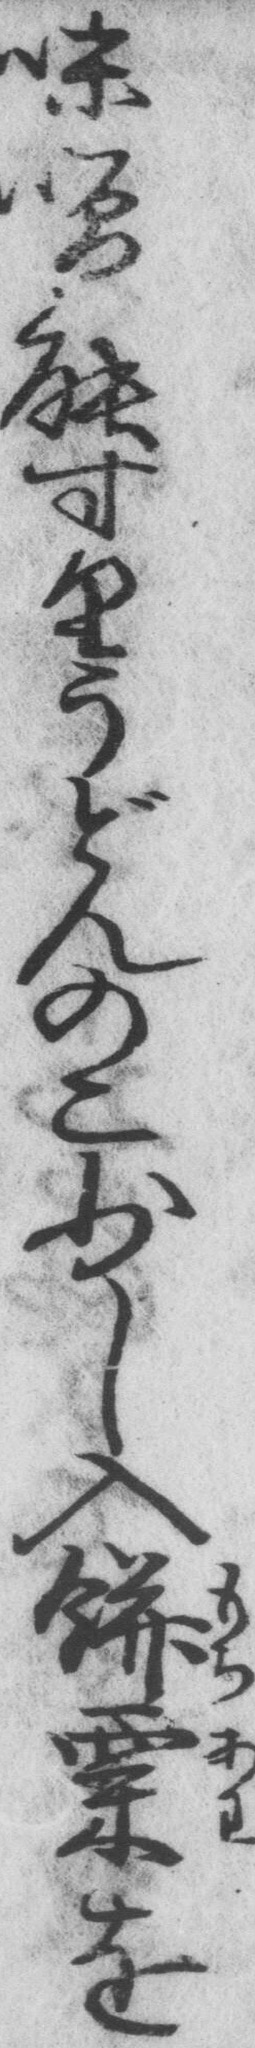味噌能すりうどんのこ少し入餅粟を
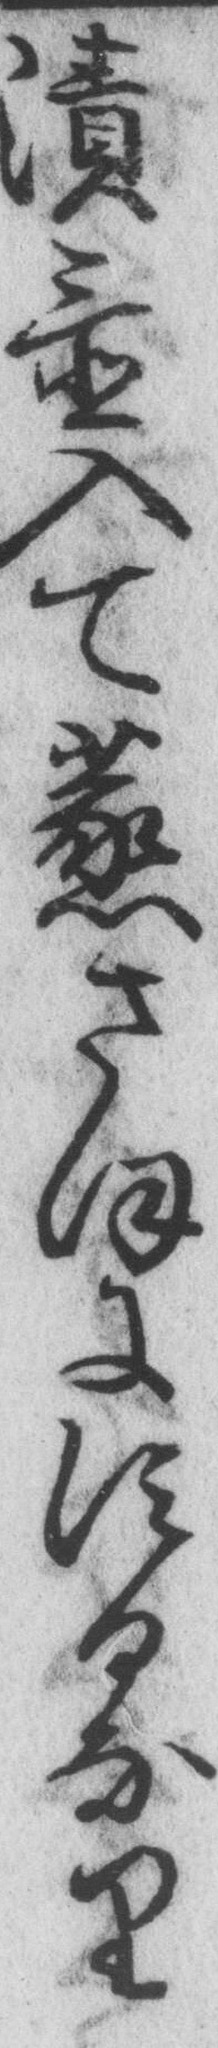漬置入て蒸さほにするなり

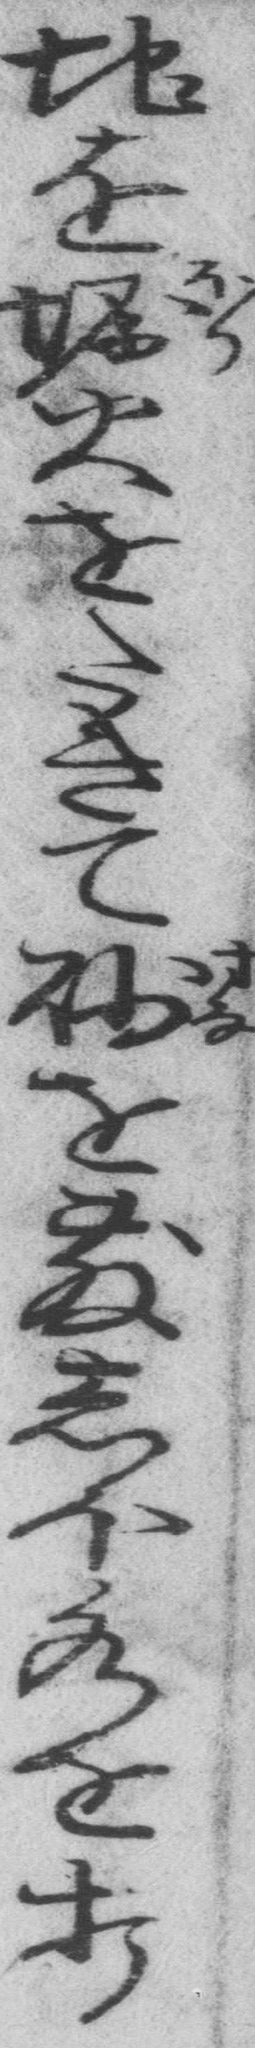地を堀火をたきて砂を敷しほ水を打
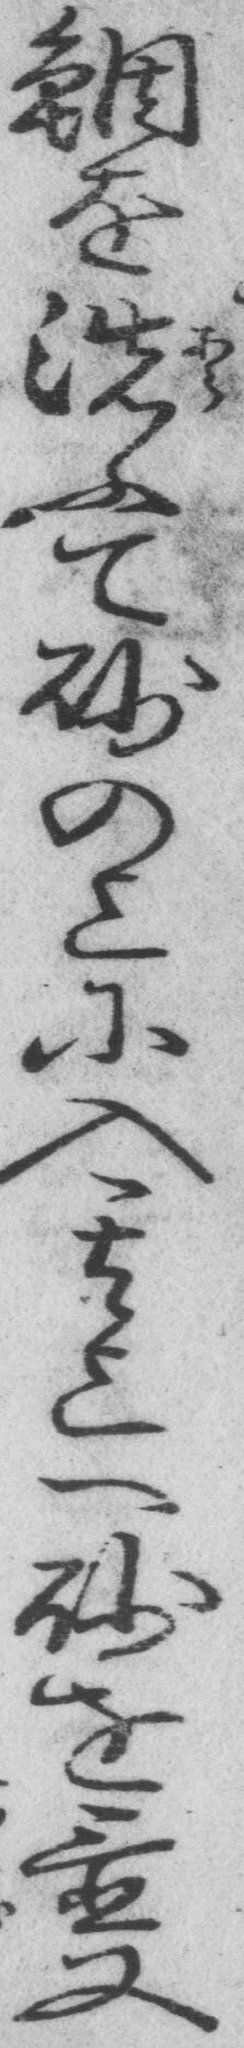鯛を洗ふて砂の上に入其上へ砂を置又
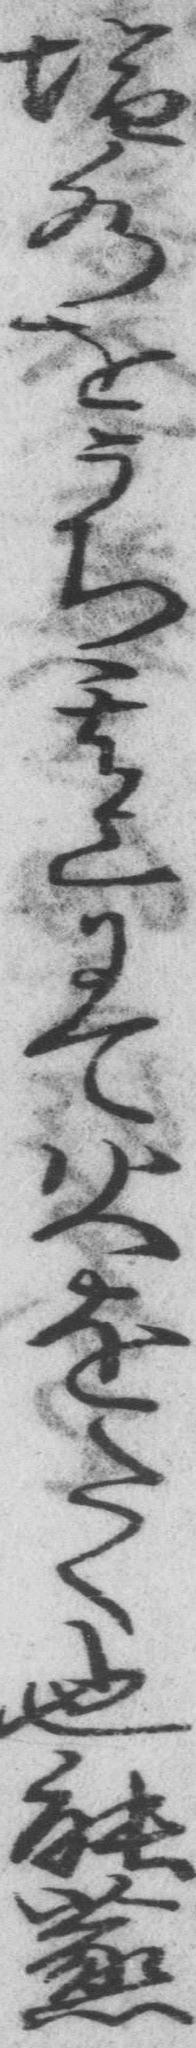塩水をうち其上にて火をたく也能蒸
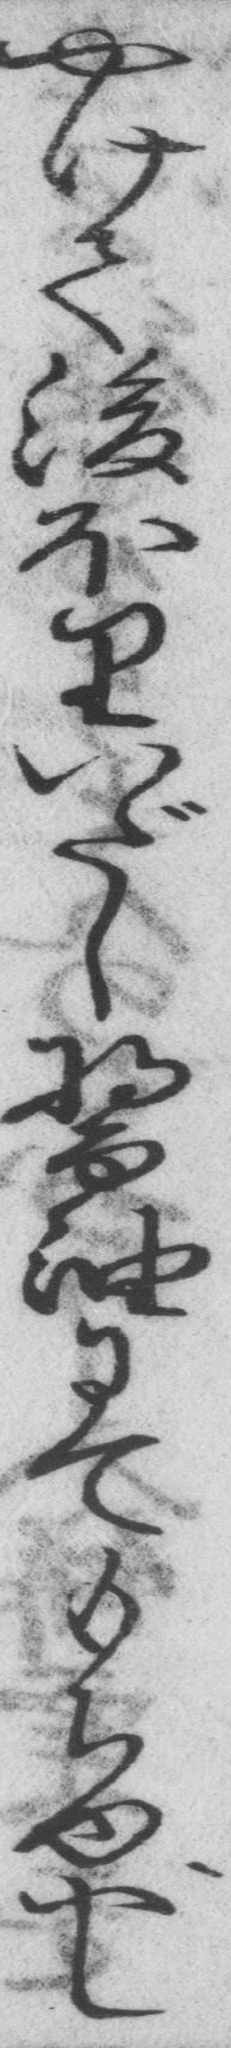やけて後ほりいだし醤油にてもちゆべし
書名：料理山海郷
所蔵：大阪府立大学学術情報センター 国文学研究資料館
